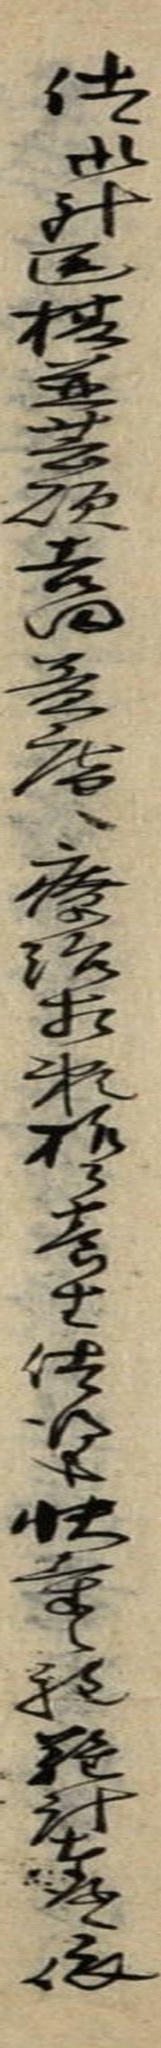仕御針医榎並芸碩吉田益庵へ療治相頼様々養生仕候得共快気之程難計奉存候依
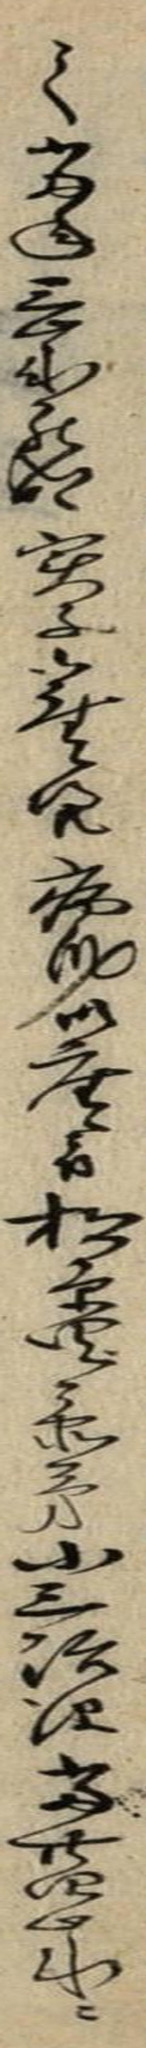之当年三歳罷成候実子御座候得共病身御座候ニ付松原四郎兵衛弟小三治儀当廿四歳ニ
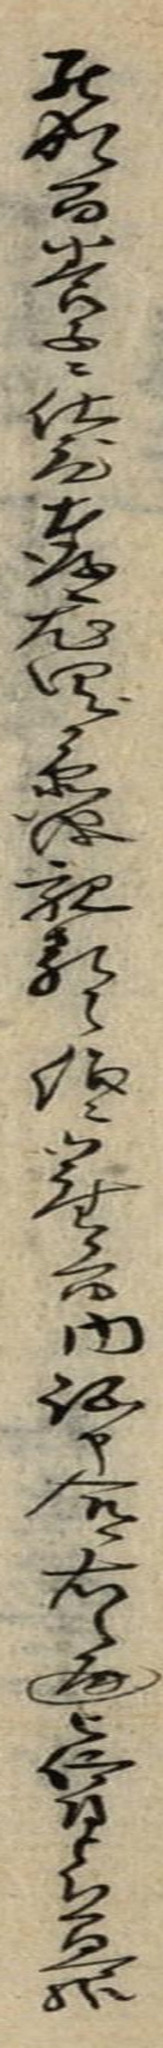罷成候間養子ニ仕度奉存候尤四郎兵衛儀親類之儀ニ御座候間内証申合候右之通被仰付被下置候様
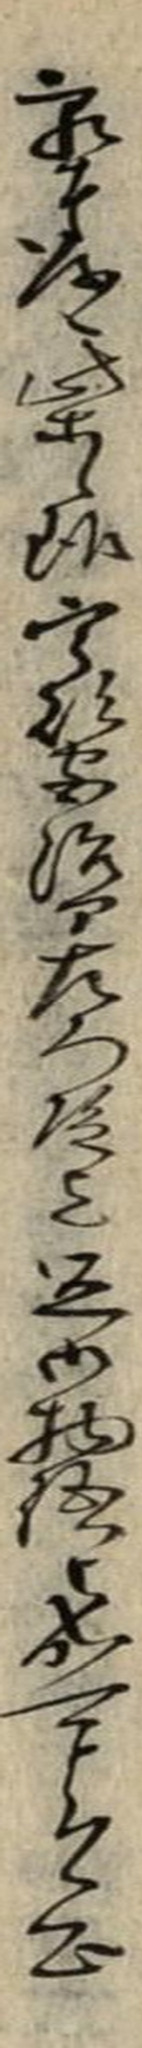願奉存候此等之趣宇都宮治部左衛門殿迄宜御物語被成可被下候以上
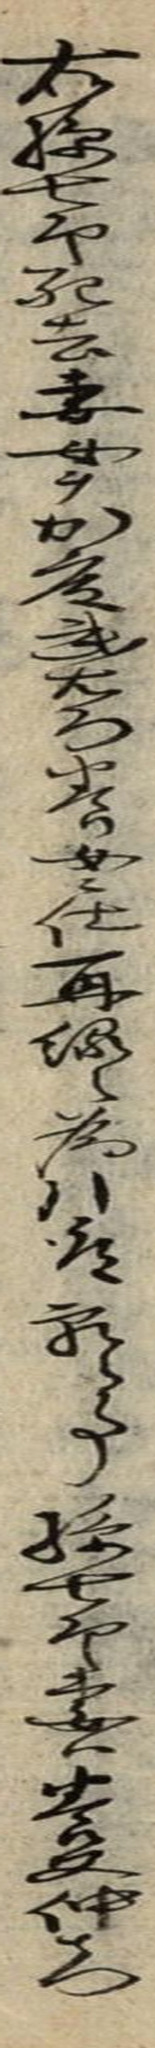右孫七郎死去妻女ヲ加藤武右衛門養女ニ仕再縁之為引取へ願候事孫七郎妻ハ養父仲右衛門
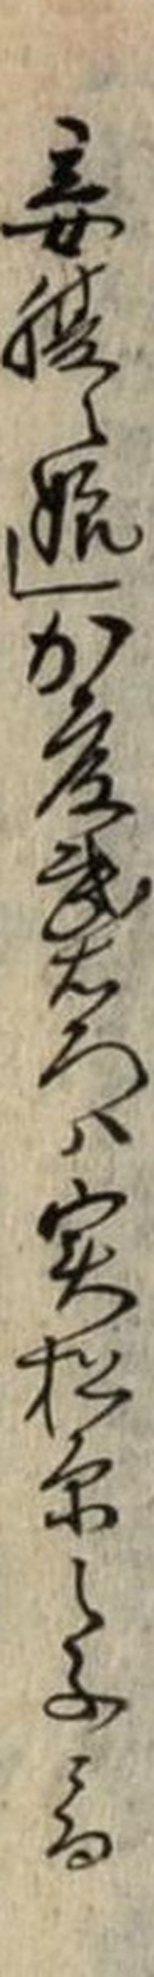妾腹之娘」加藤武右衛門ハ実松原之子ニ而
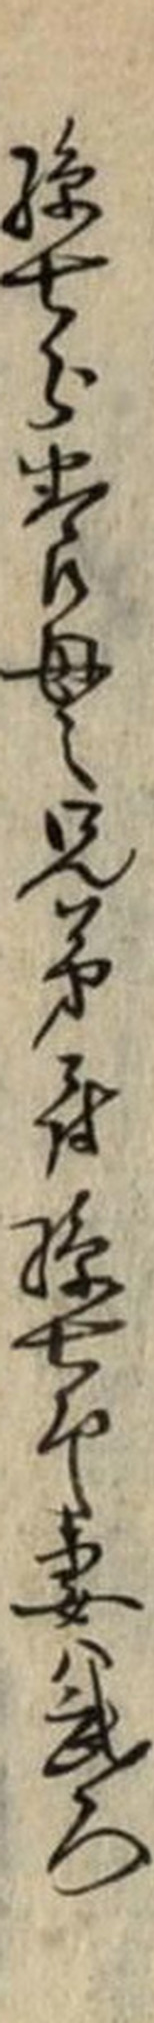孫七郎養母之兄弟ニ付孫七郎妻ハ武右衛門
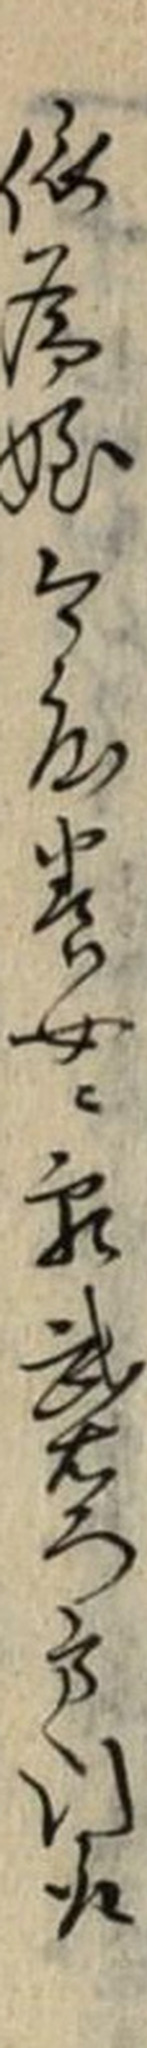依為姪今度養女ニ願武右衛門方引取
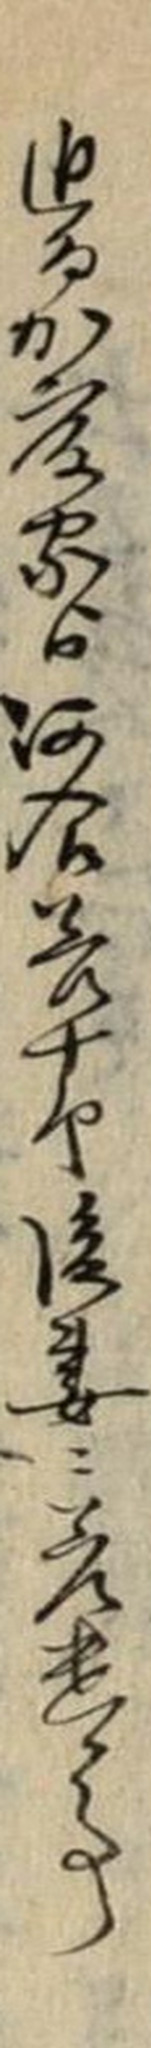追而加藤家ゟ河合善十郎後妻ニ差遣候事
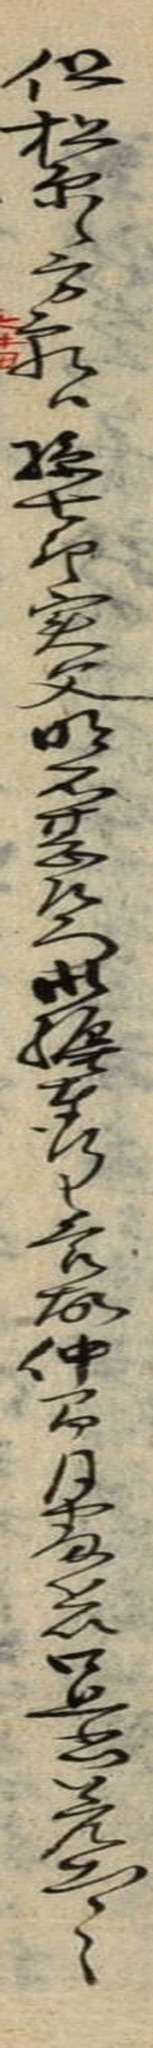但松原之方願ハ孫七郎実父明石甚左衛門御纏奉行之節仲間月番を以口上書差出之
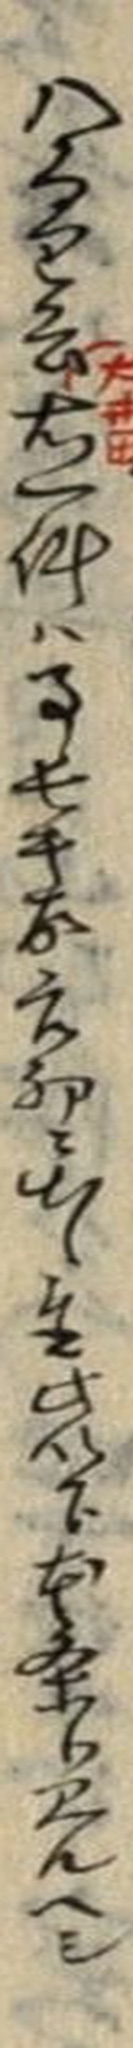八百里云右一件ハ事長キ故節初ニ出し置此以下本条ト見ルヘシ
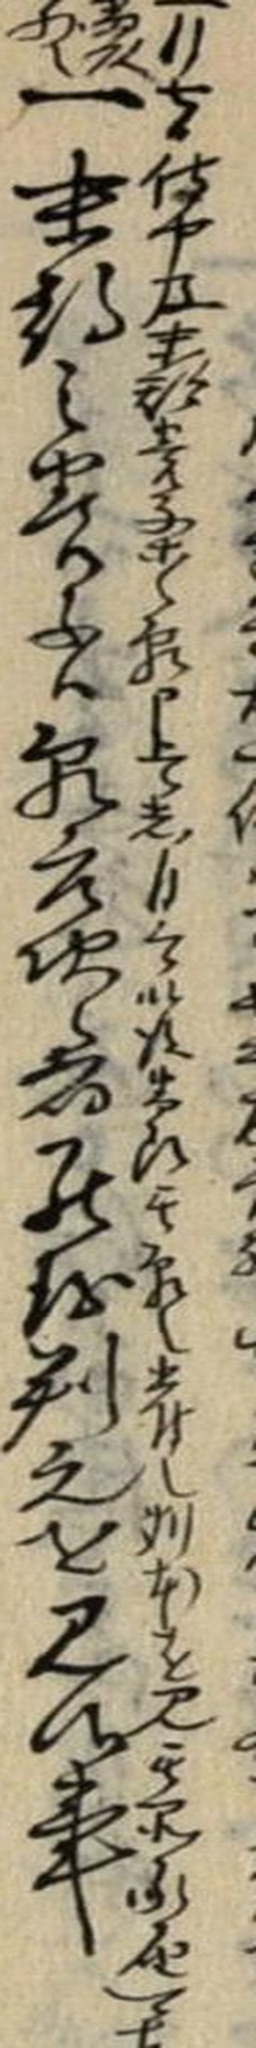一末期之養子ハ願取次之者罷越判元を見候事
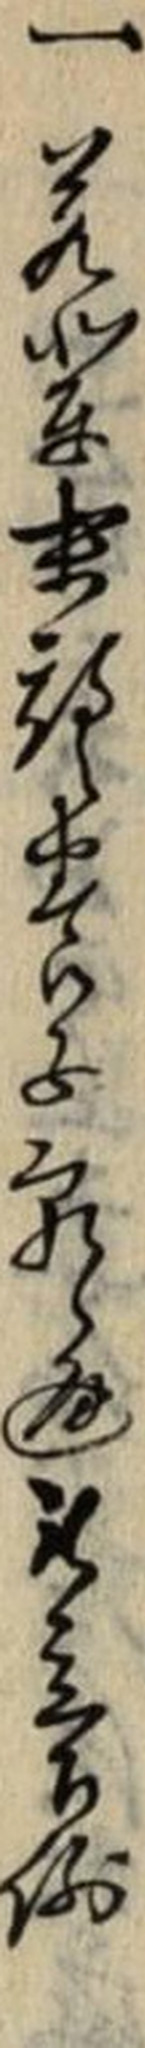一若輩末期之養子願之通被立下例
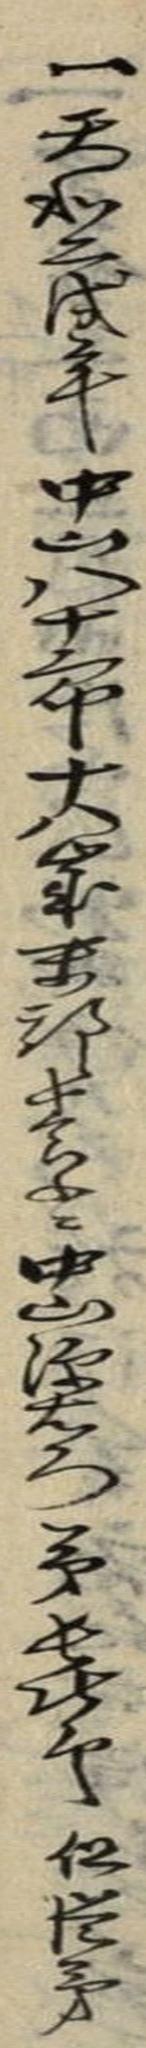一天和二戌年中山八十郎十八歳末期養子ニ中山源右衛門弟長次郎但従弟
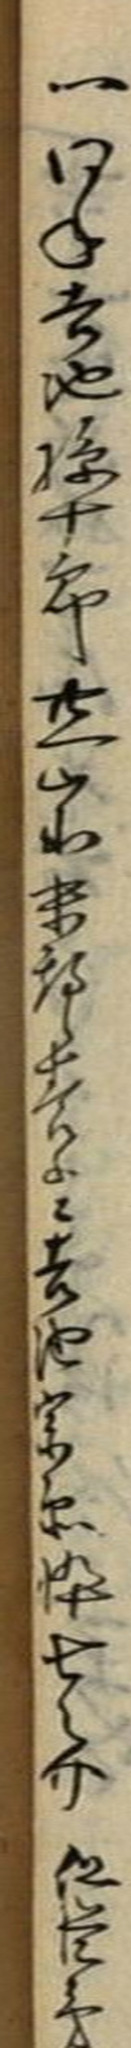一同年吉池孫十郎廿一歳末期之養子ニ吉池宗兵衛悴七之助但従弟
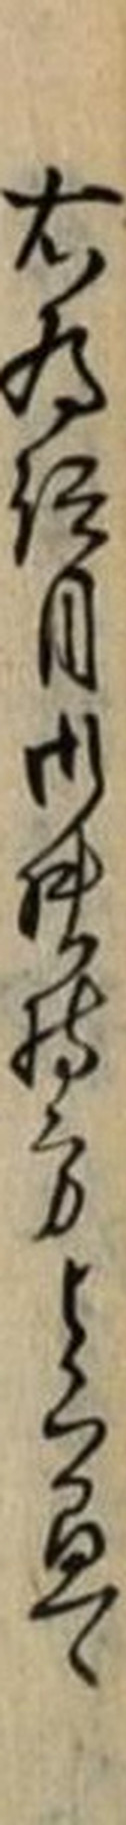右為跡目御扶持方被下置候
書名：養子縁組之部
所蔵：福井県文書館 Fukui Prefectural Archives
